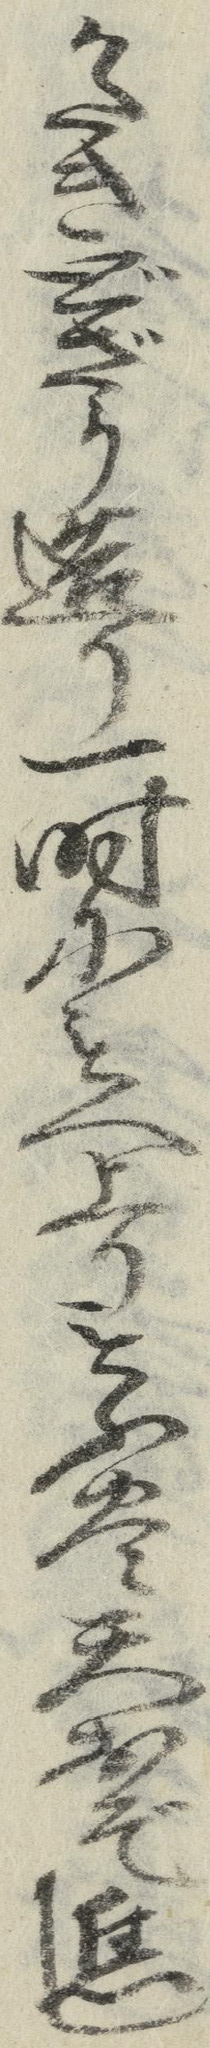かたきどざう造り一時にもへ上りもふ炎天おぞ焦し
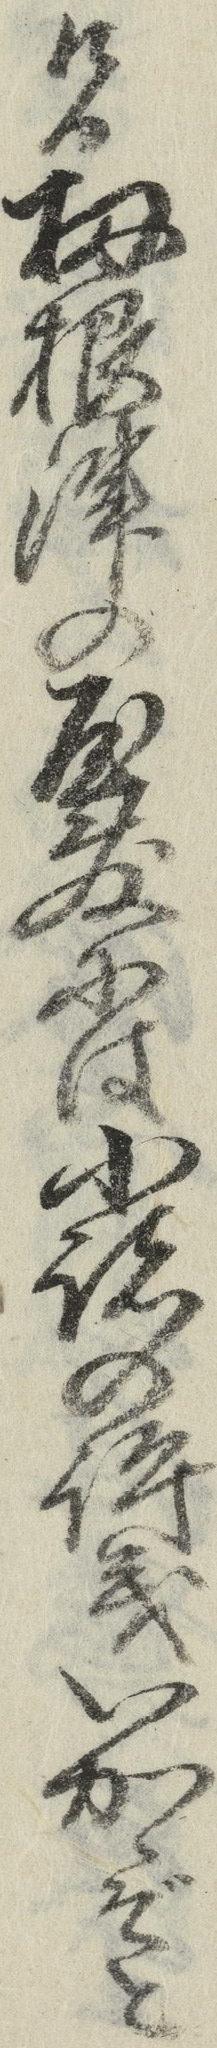ける扨根津の屋敷には小諸の侍義いかゝぞと
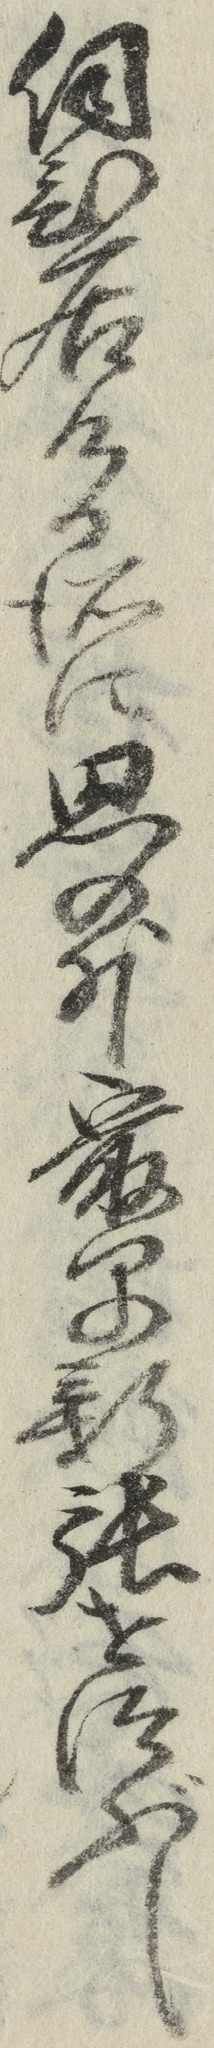伺ひ居ける所に思の外最早新張をつぶし
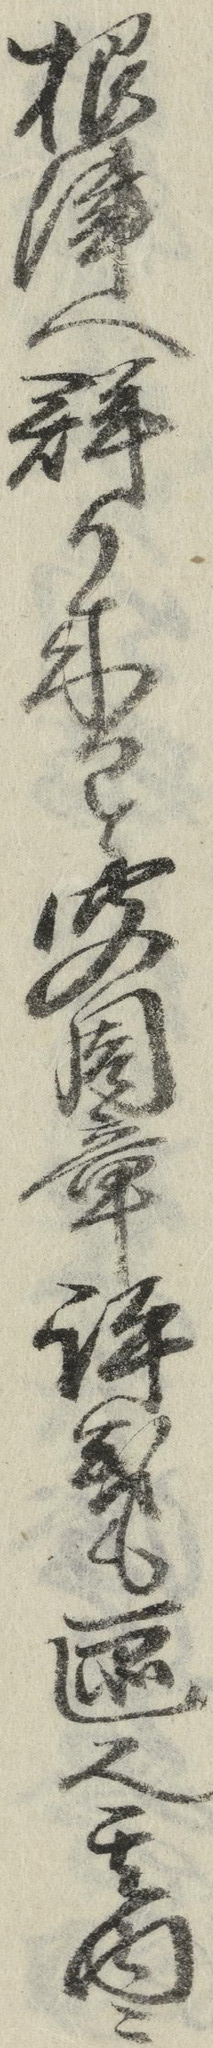根津へ群り来るを聞周章評義も區也其内に
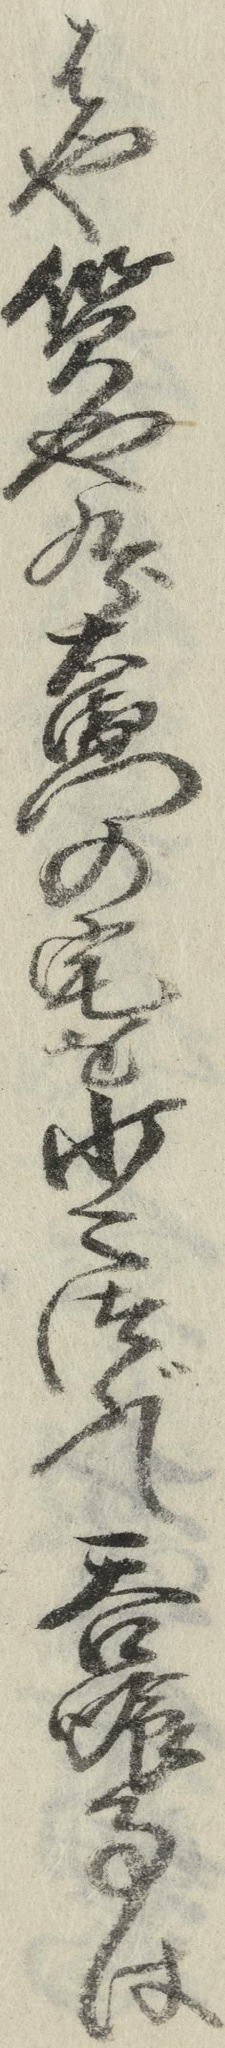はや質や九郎右衛門の宅を少々つぶし呑喰事は
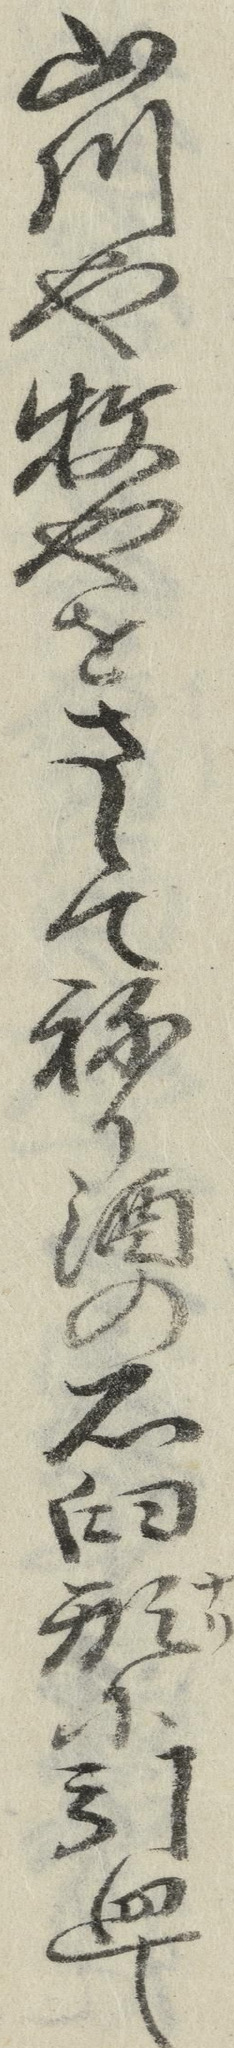山川や牧やをさしてねり酒の石臼形に引廻し
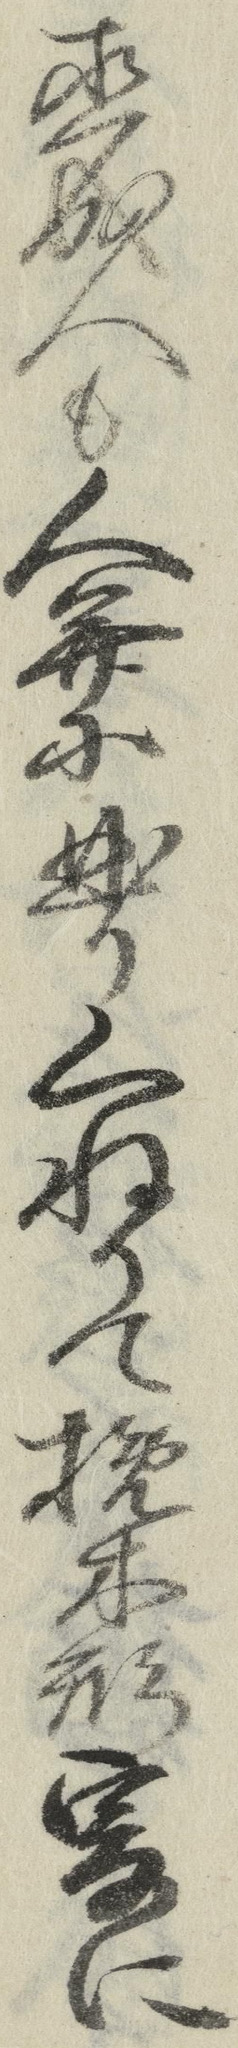置成人も人幷に曲りくねりて挽木形爰に
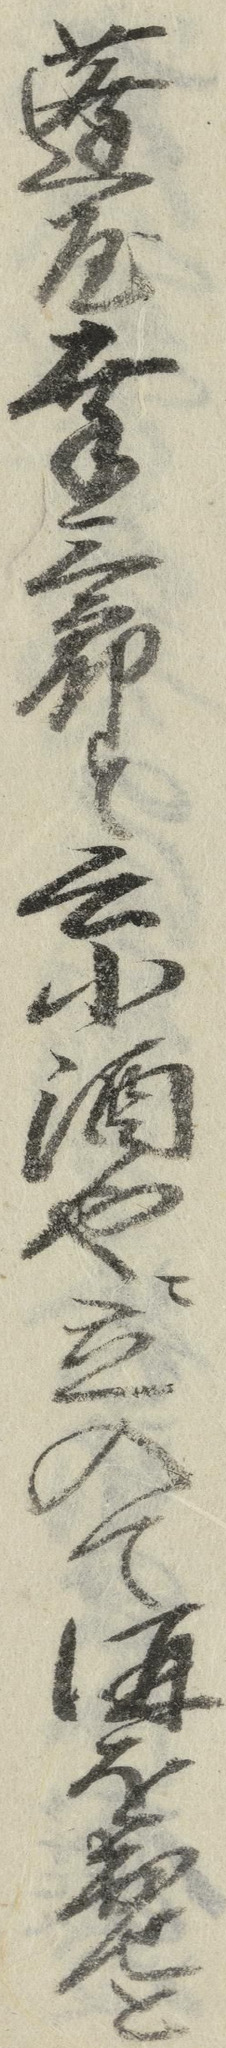蓬屋幸三郎と云小酒やに立入て酒を出せと

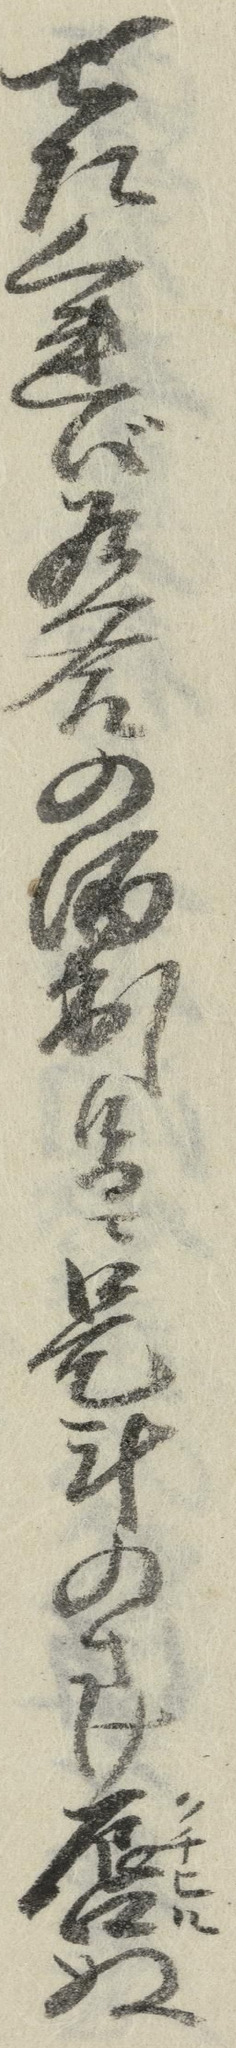せたくれば有合の酒出しけるに是計のさけ唇ぬ
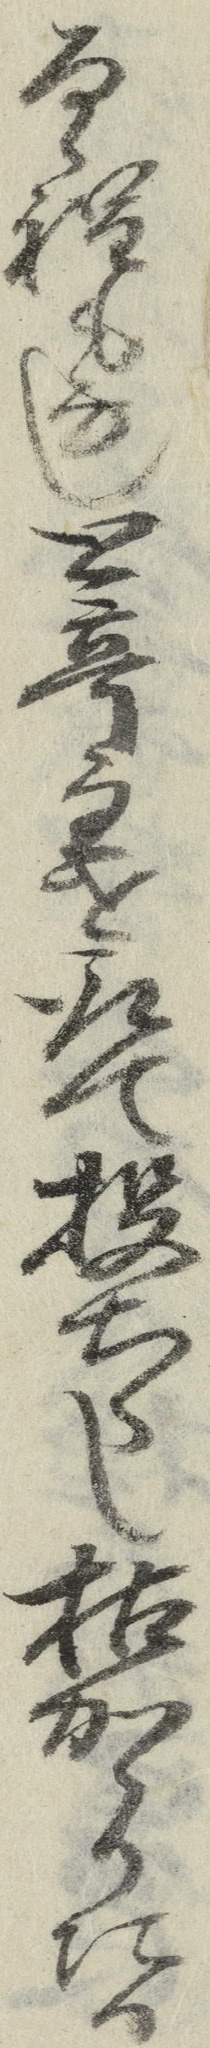るゝ程もなしと亭主を取て投ちらし枯かゝりたり
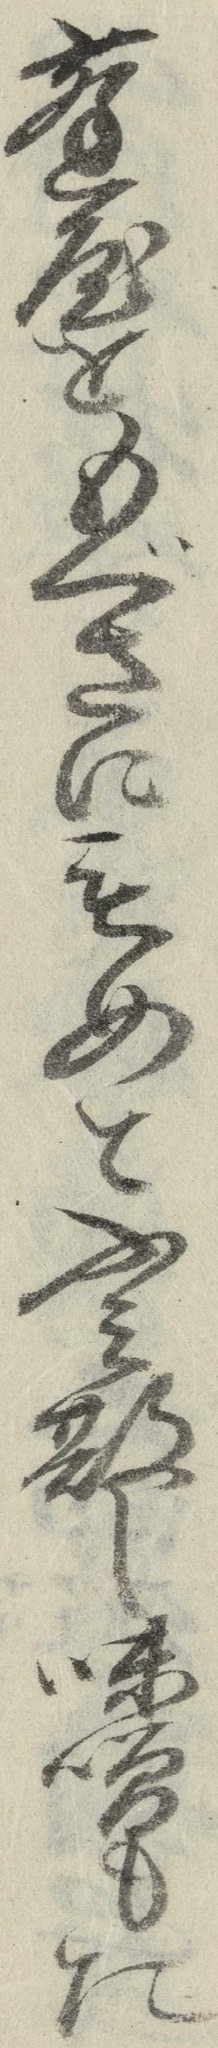蓬屋をもぐさにもめとふみ散し味噌もた
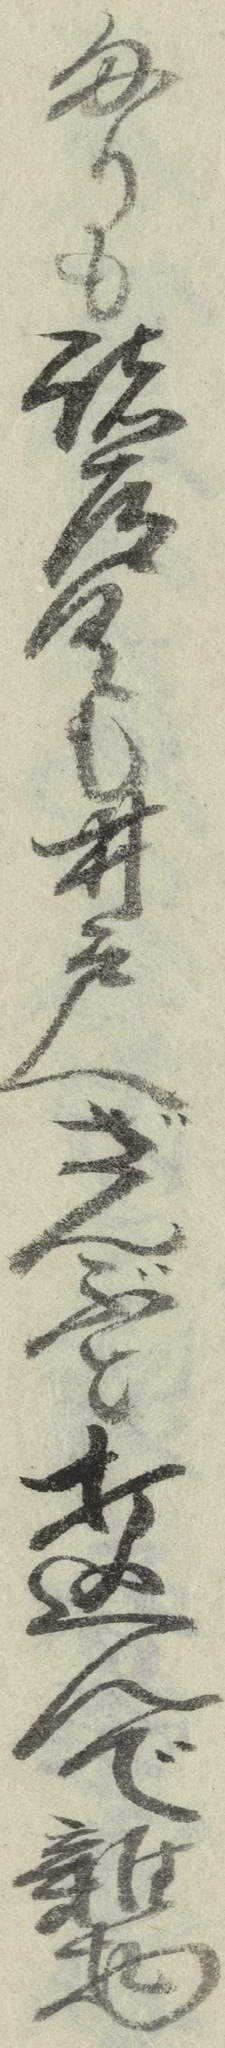まりも諸道具も井戸へざんぶと打込んで雑物
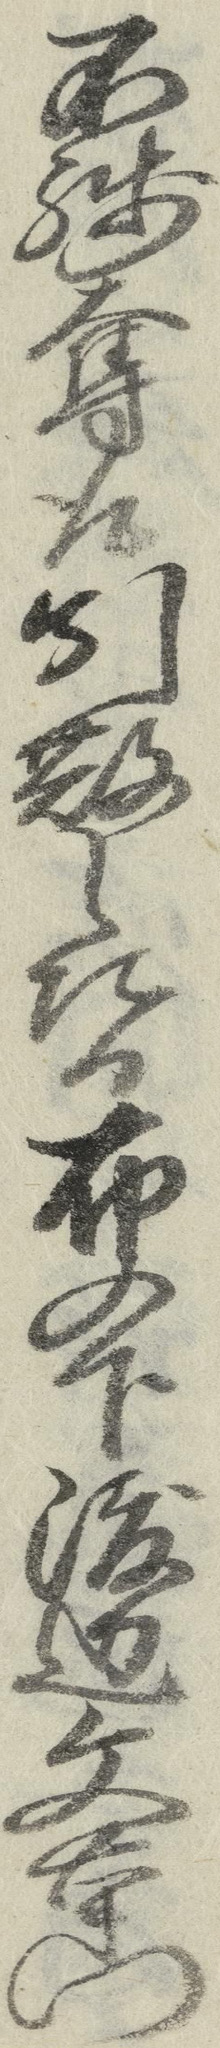不残奪取引散したる布の下渡辺文右衛門
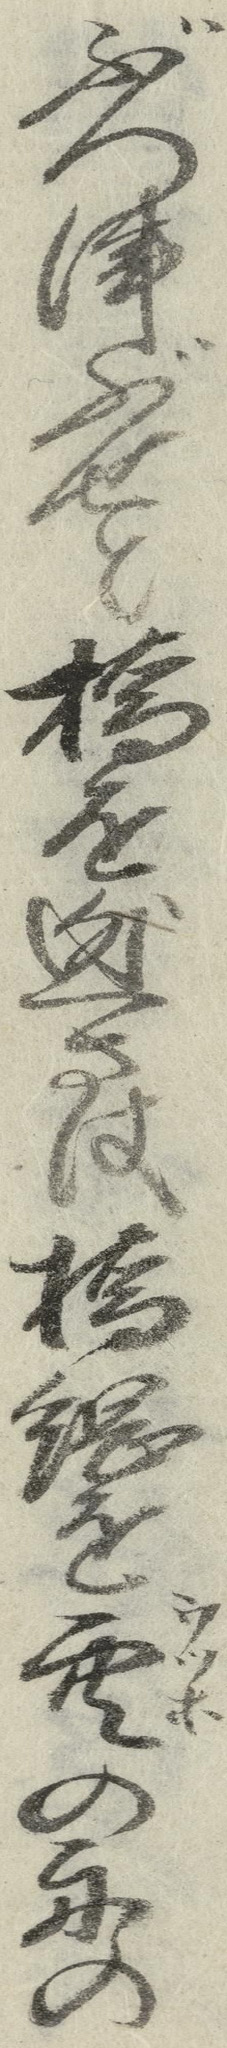ぶつつぶせと橋近迯さは橋綱を空の船の
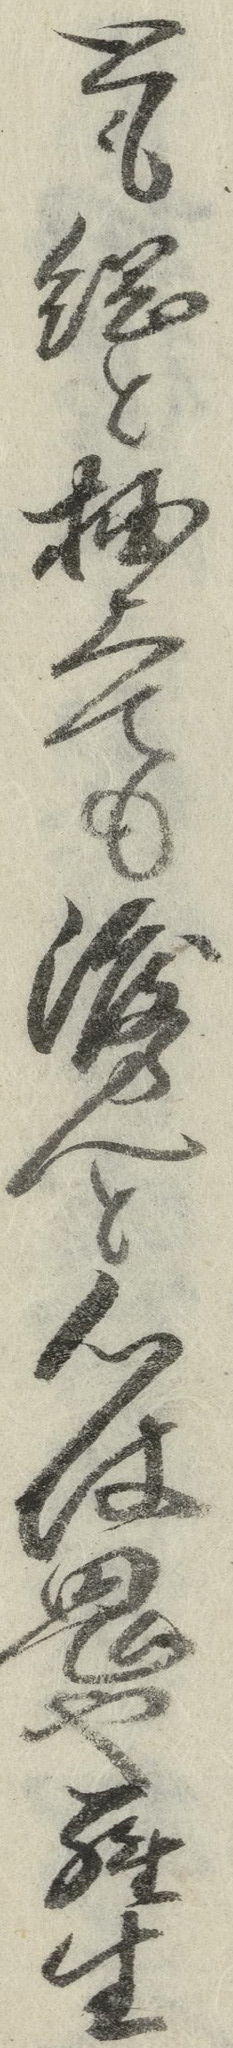とも綱と柚上ても渡らんと心は鬼や羅生
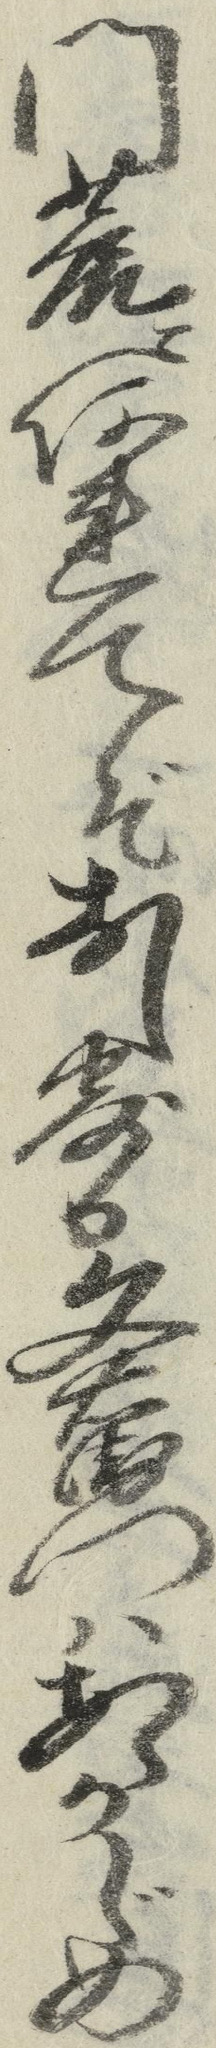門荒にあれてぞ出し寄る文右衛門はあらかじめ
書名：浅間大焼騒動記　下
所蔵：東京大学地震研究所図書室 Earthquake Research Institute Library, The University of Tokyo, JAPAN
